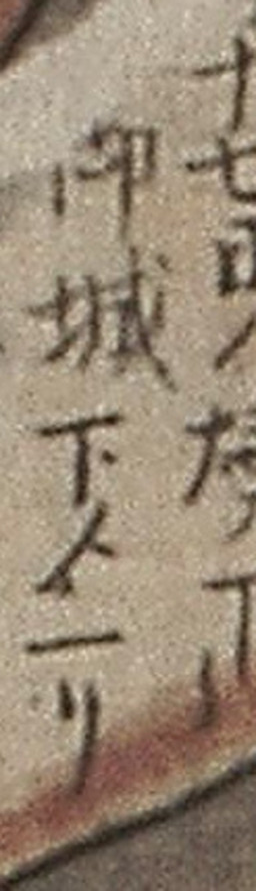御城下ゟ一里
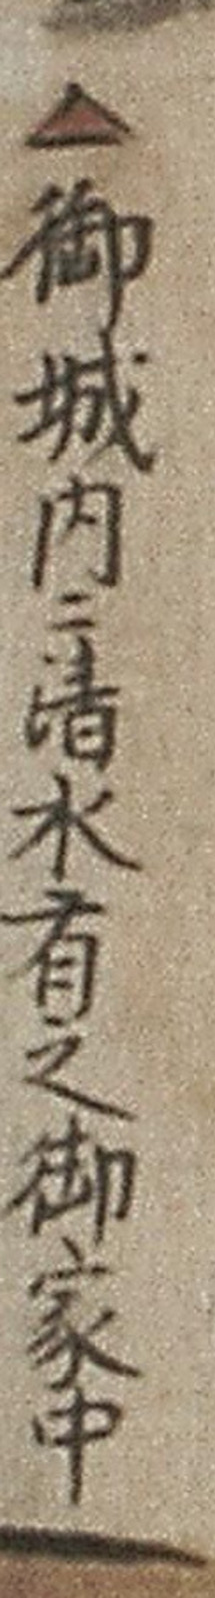▲御城内二清水有之御家中
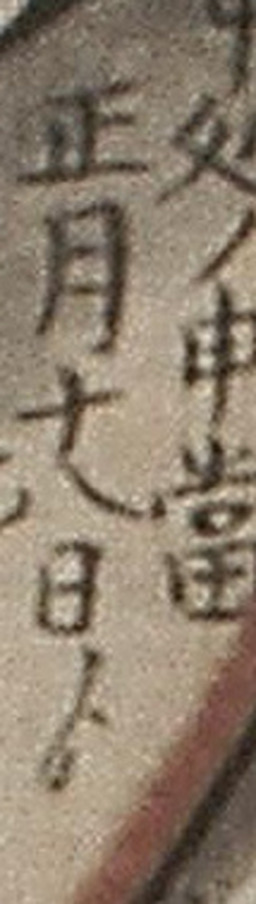正月十八日ゟ
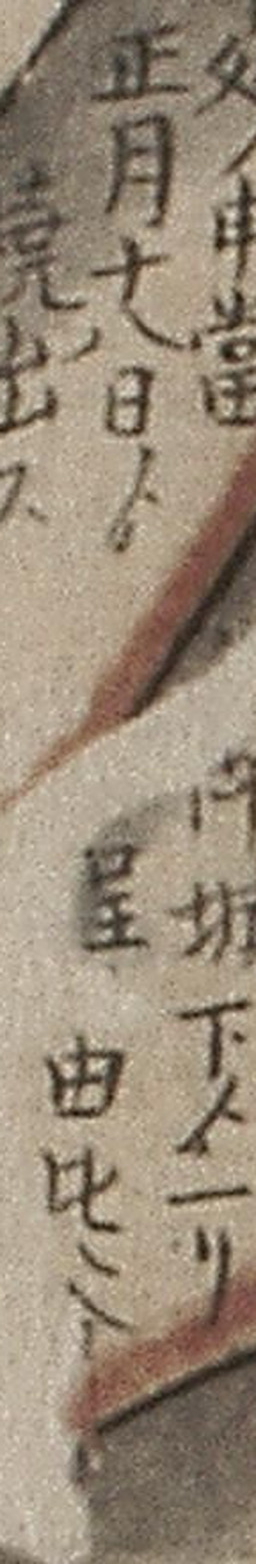正月十八日ゟ
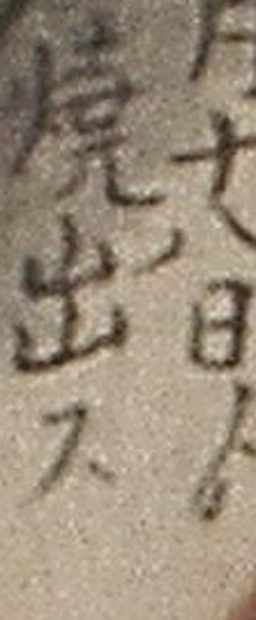焼出ス
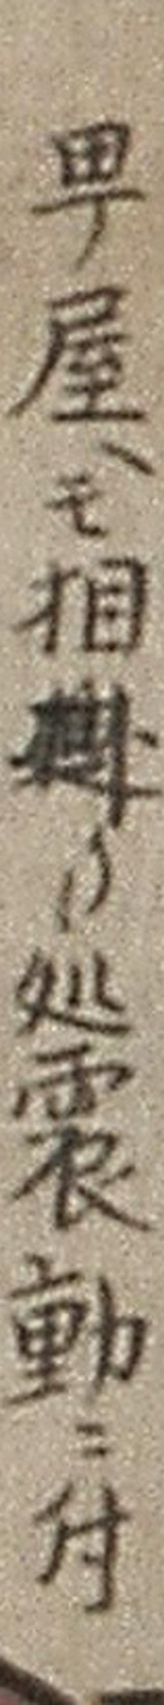町屋ヘモ相掛り候処震動二付
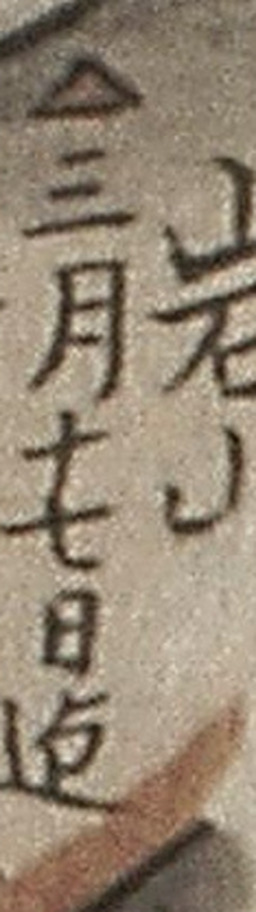▲三月十七日迄
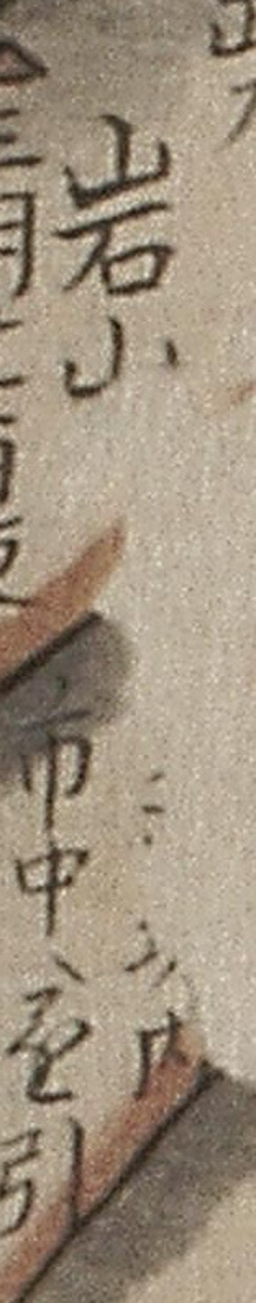▲三月十七日迄
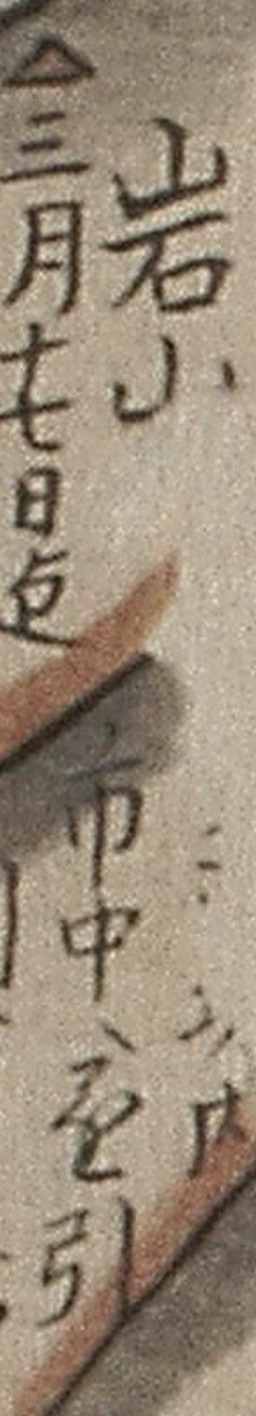▲三月十七日迄
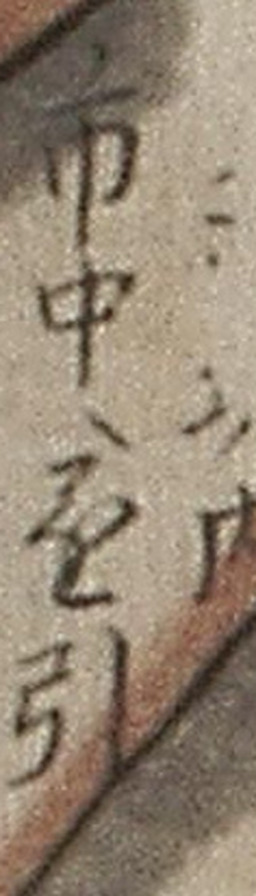市中へ懸引
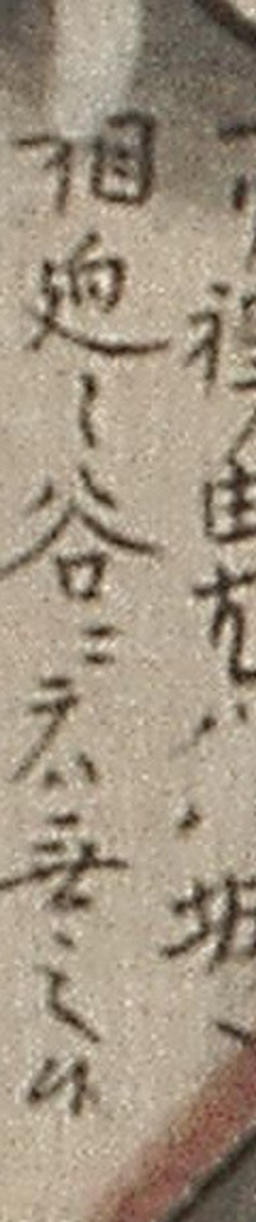相廻之谷ニテハ無之候
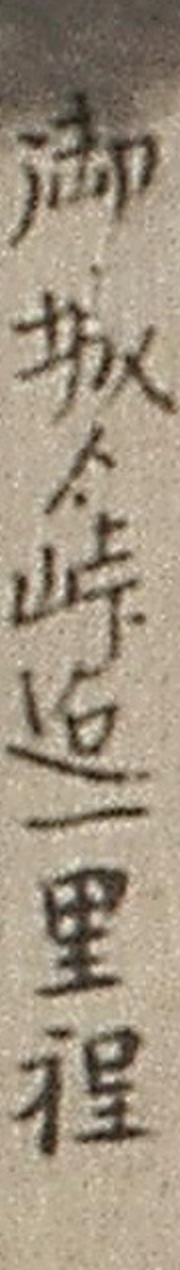御城ゟ峠迄一里程
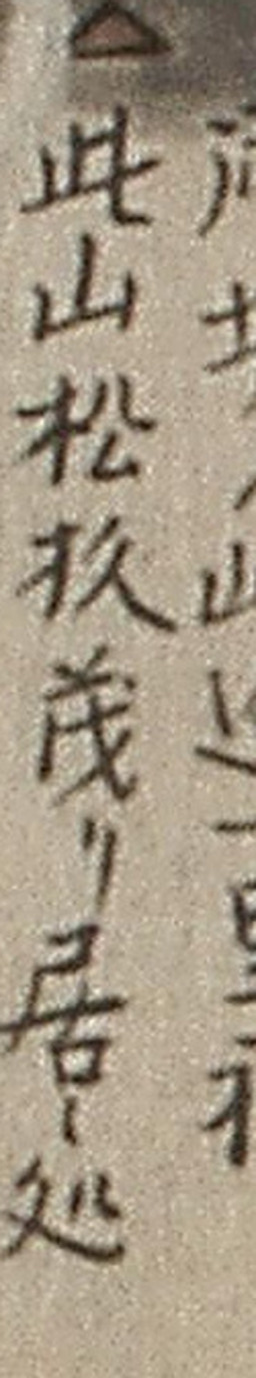▲此山松杉茂り居候処
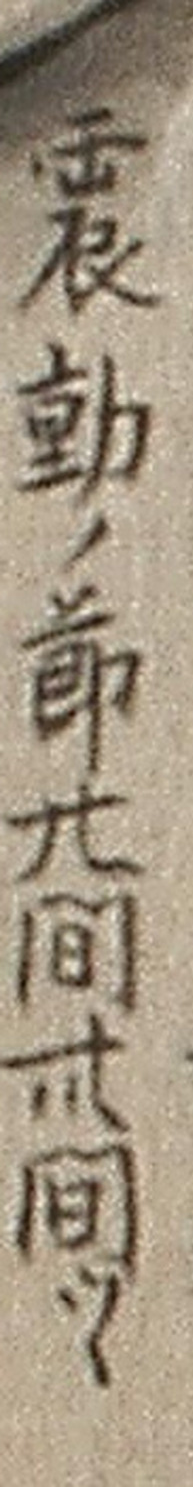震動ノ節廿間卅間ヅゝ
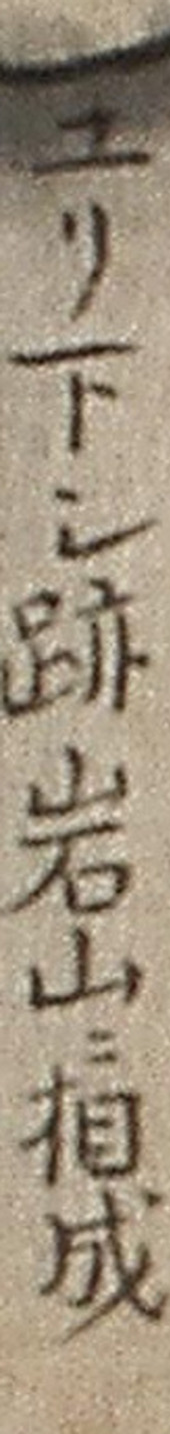ユリ下シ跡岩山二相成
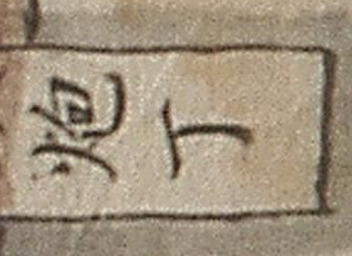鉄炮丁
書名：太平秘録抜書　浅間山燒及普賢山崩
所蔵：東京大学地震研究所図書室 Earthquake Research Institute Library, The University of Tokyo, JAPAN
